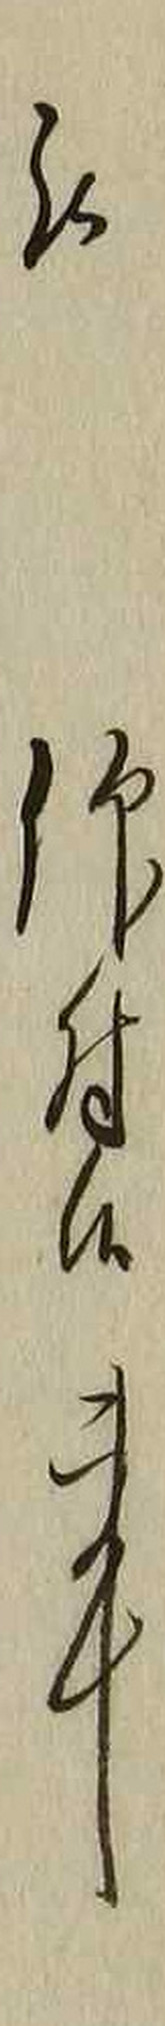被仰付候事
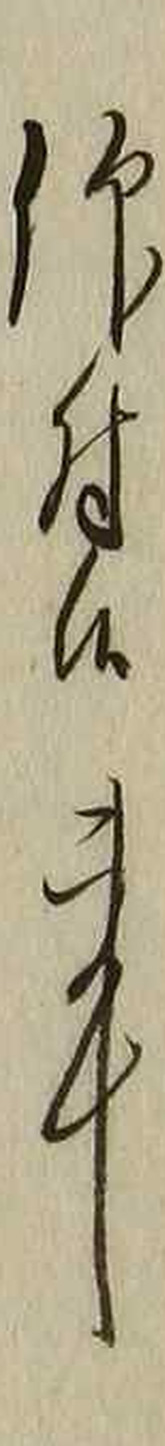仰付候事
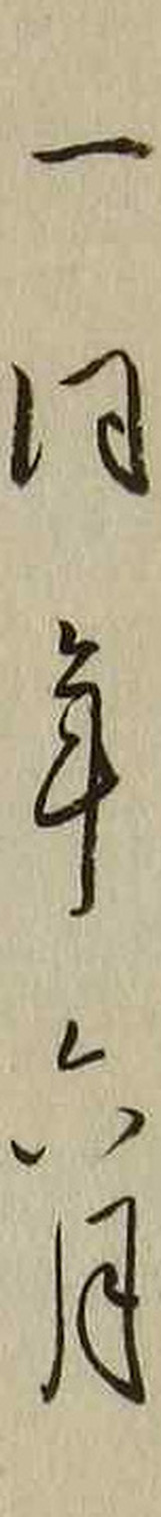一同年六月
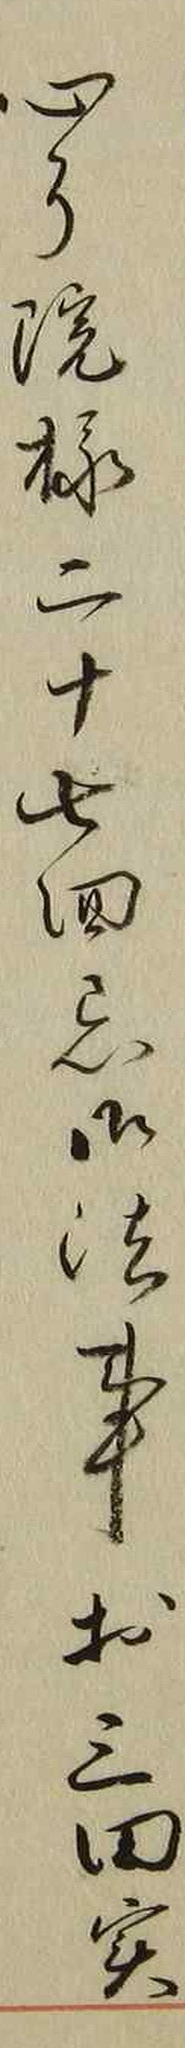心了院様二十七回忌御法事於三田実
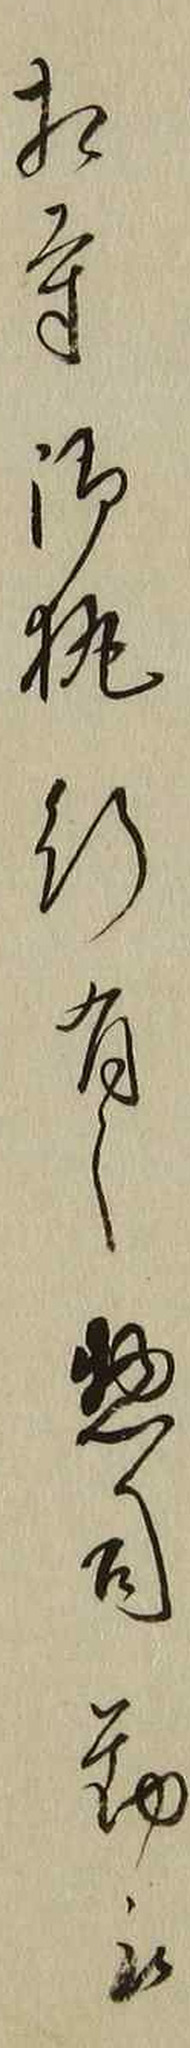相寺御執行有之惣司勤被
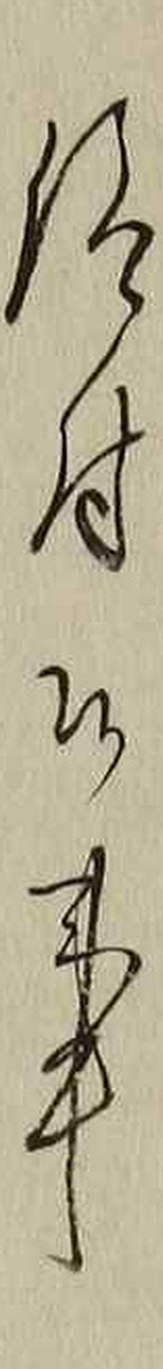仰付候事
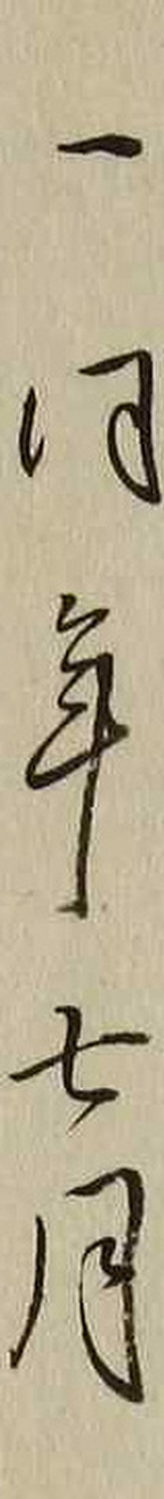一同年七月
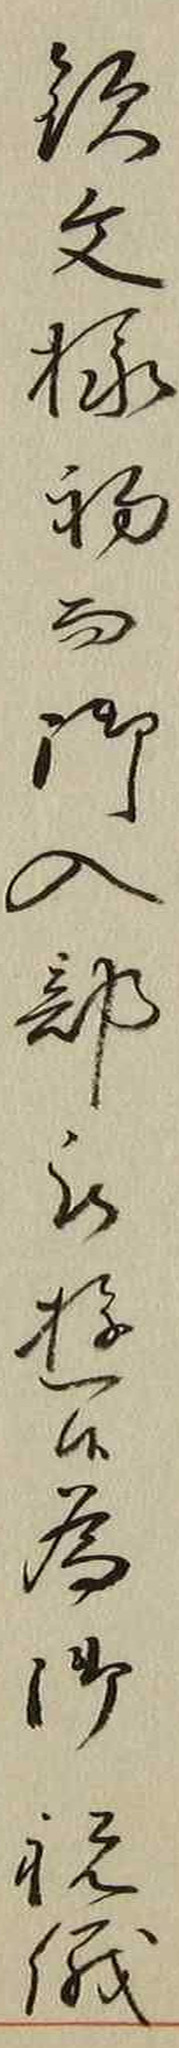文様初而御入部被遊候為御祝儀
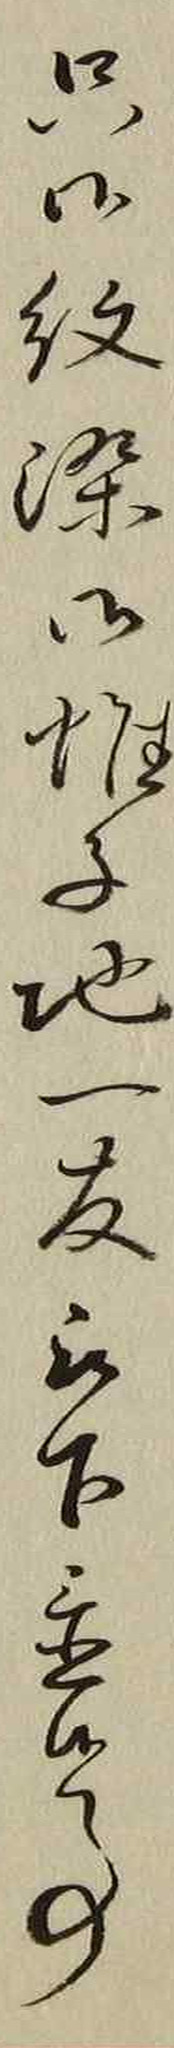只御紋染御帷子地一反被下置候事
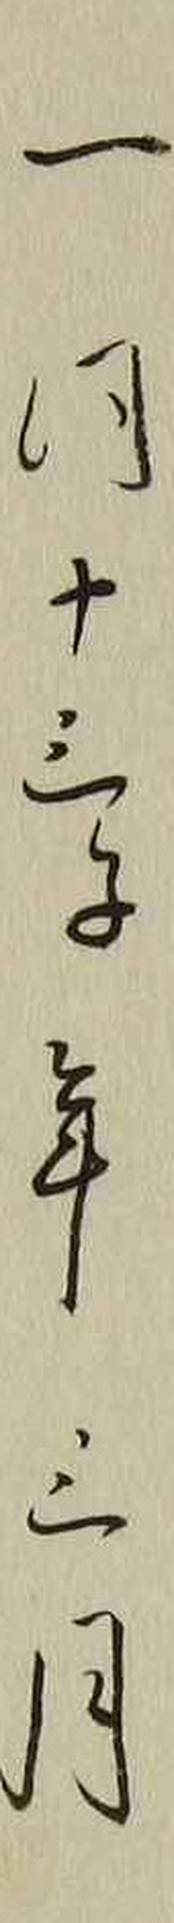一同十三子年三月
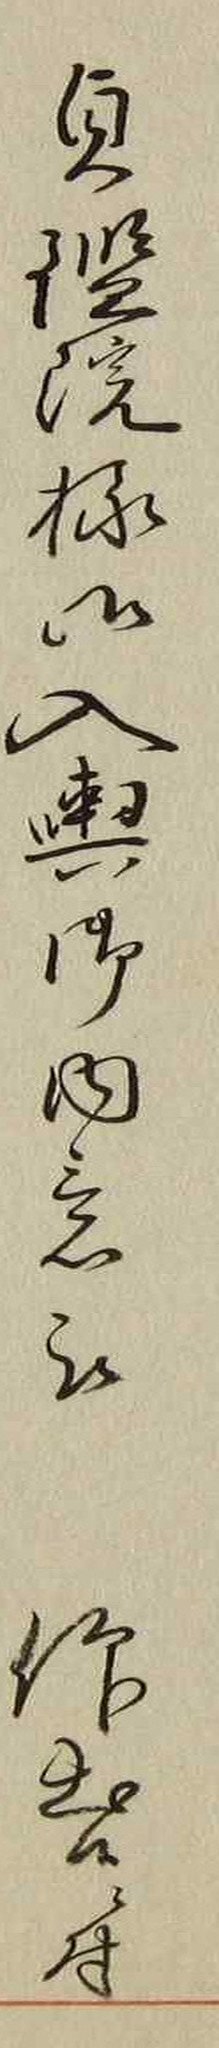貞鑑院様御入輿御内意被仰出候に付
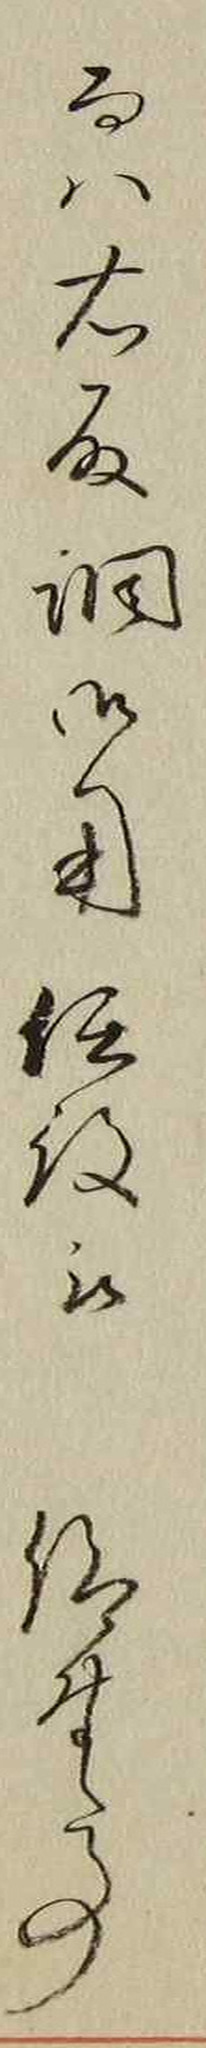而は右取調御用任役被仰付候事
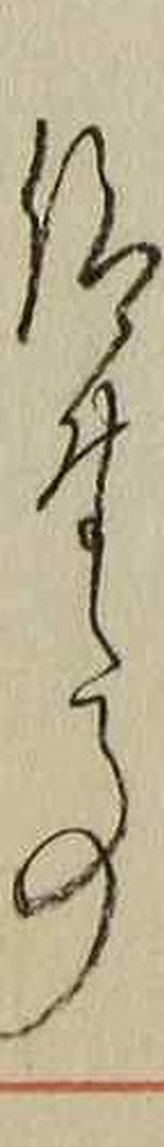仰付候事
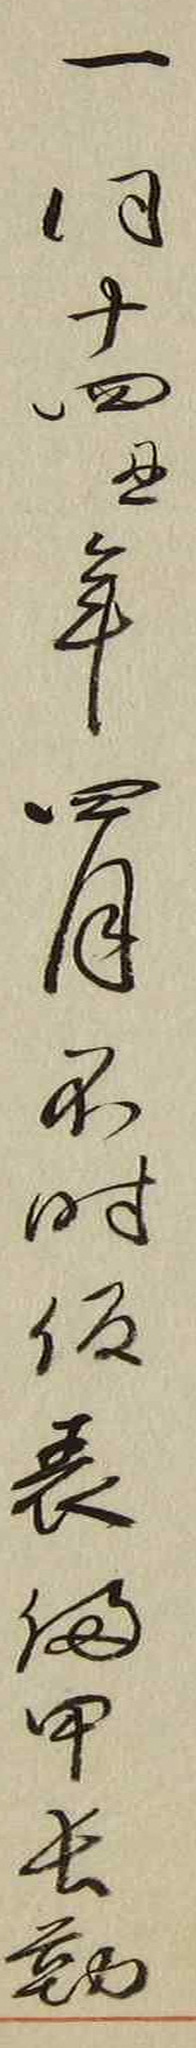一同十四丑年四月不時仮表備甲長勤
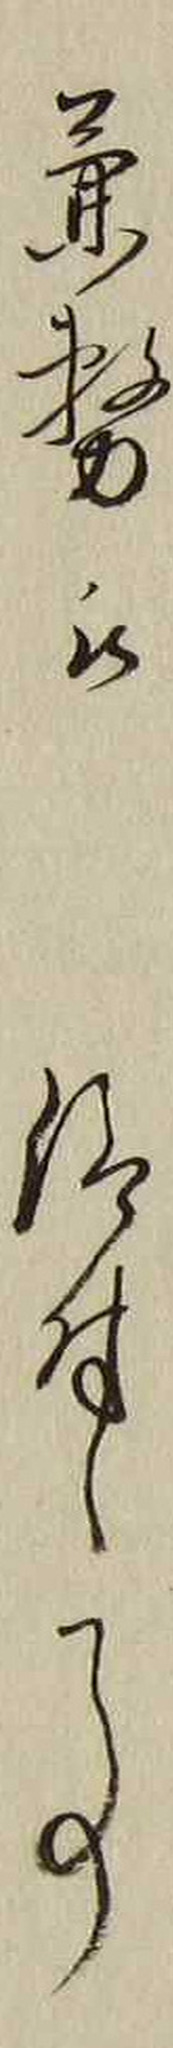兼務被仰付候事
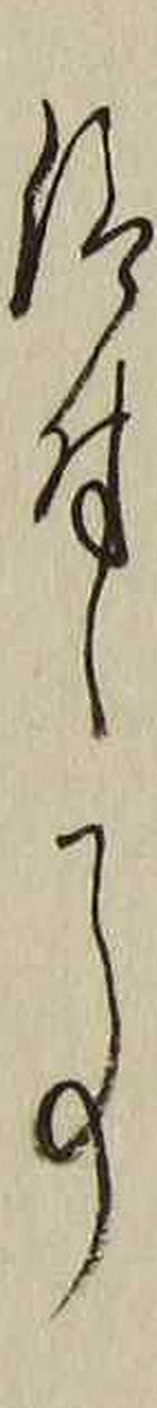仰付候事
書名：諸士系譜　巻之1　い之部1
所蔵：会津若松市立会津図書館
